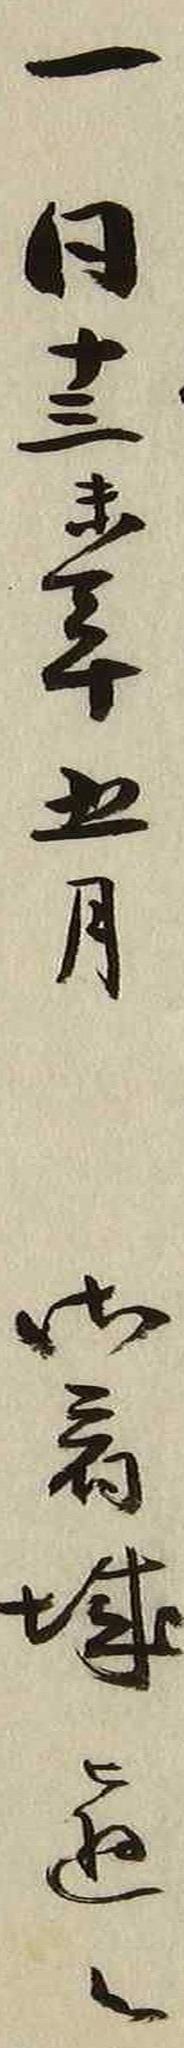一同十三未年五月御着城被遊候
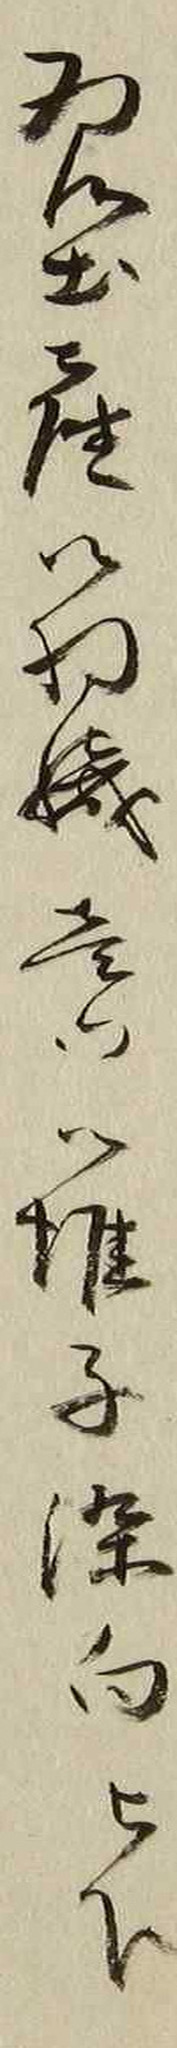為御土産御羽織壱つ御帷子染白被下
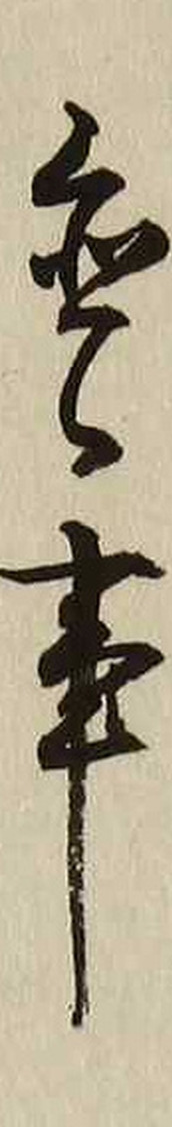置候事
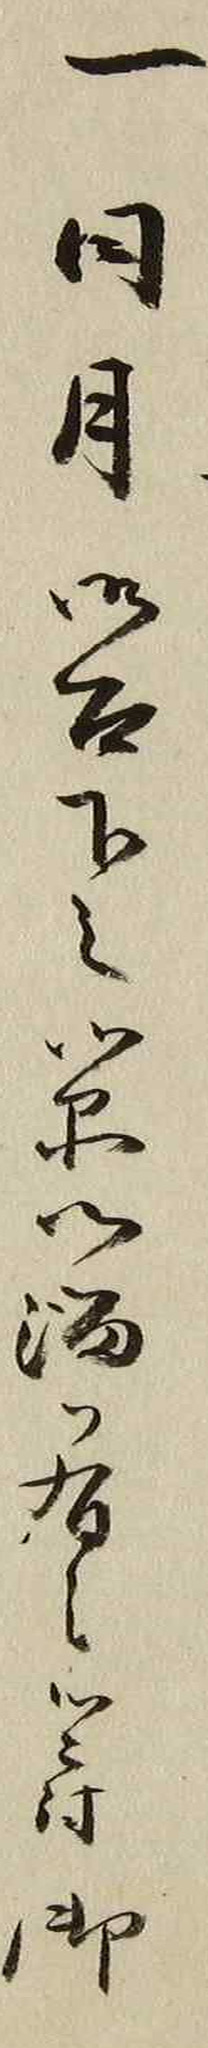一同月御召下之御品御溜り有之候に付御
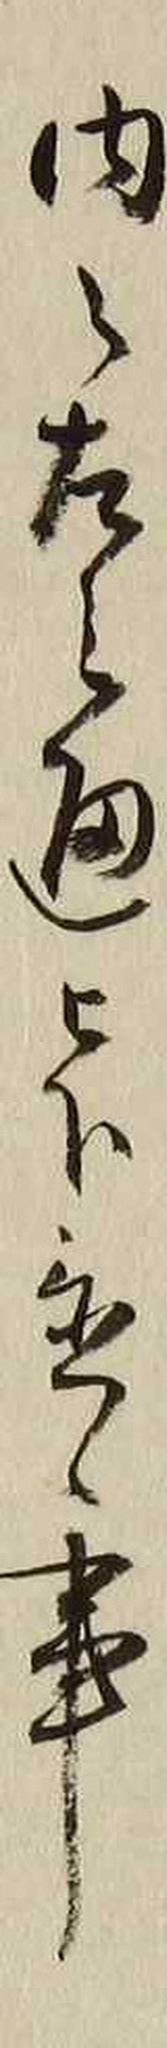内々左之通被下置候事
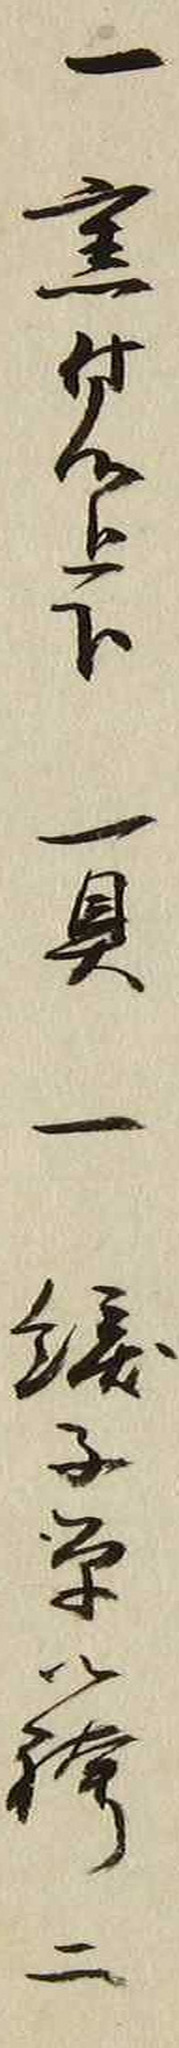一裏付御上下一具一綟子子単御袴二
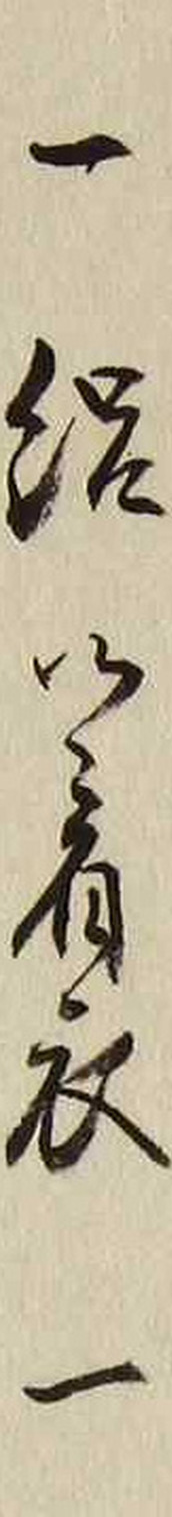一絹御肩衣一
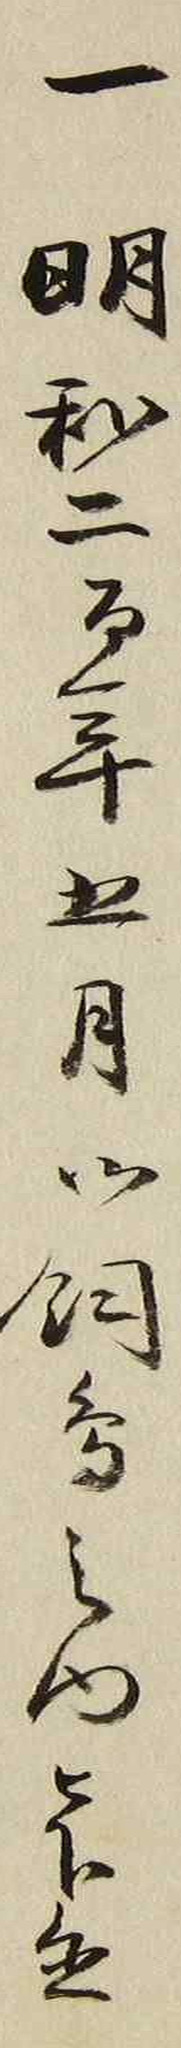一明和二酉年五月御飼鳥之内被下置
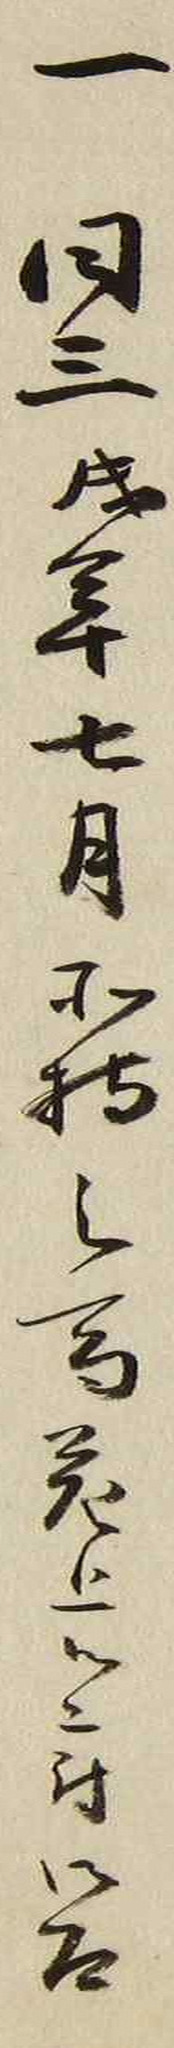一同三戌年七月所持之馬差上候に付御召
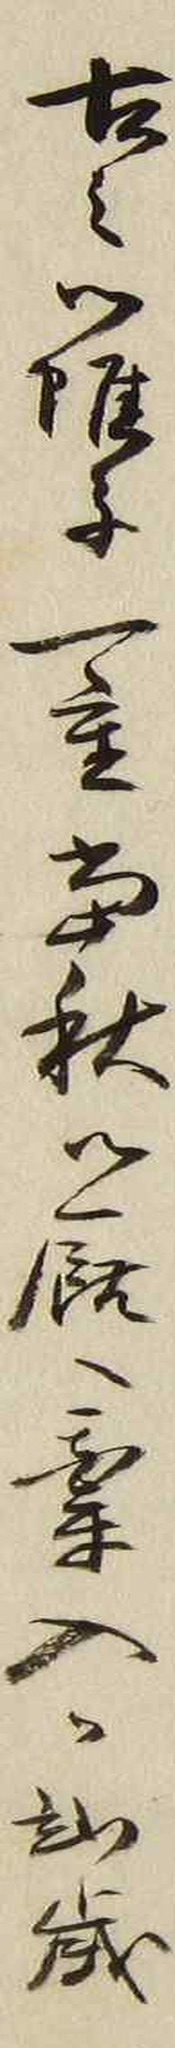古之御帷子一重当秋厩へ乗入候弐歳

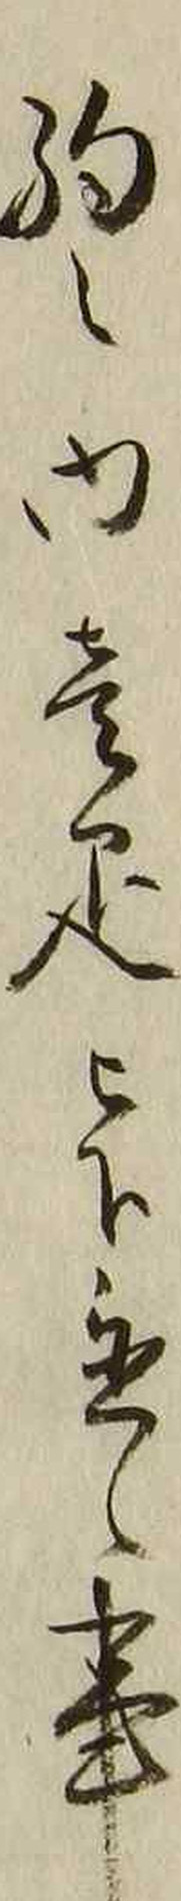駒之内壱疋被下置候事
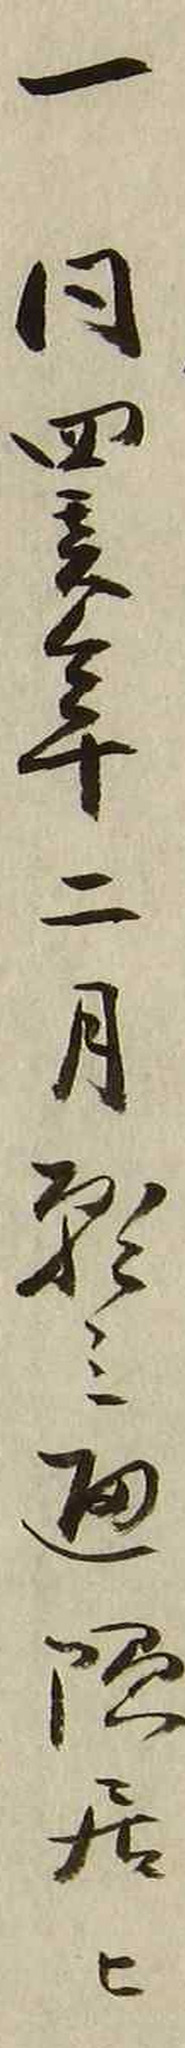一同四亥年二月願之通隠居被
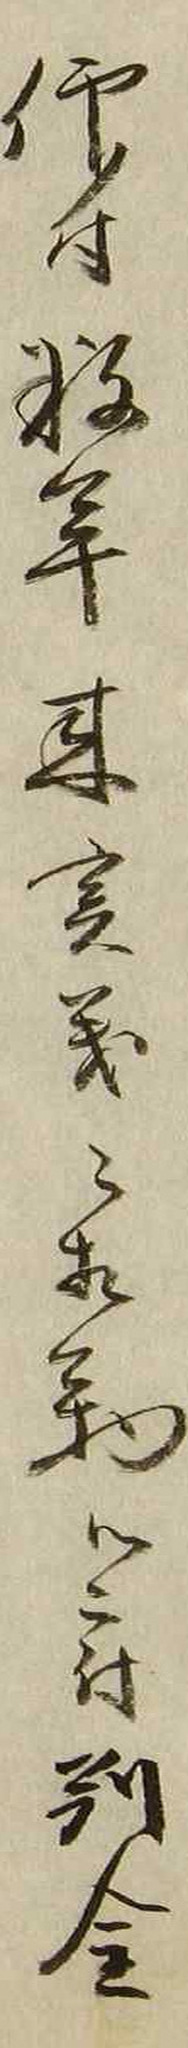仰付数年來実義に相勤候に付判金
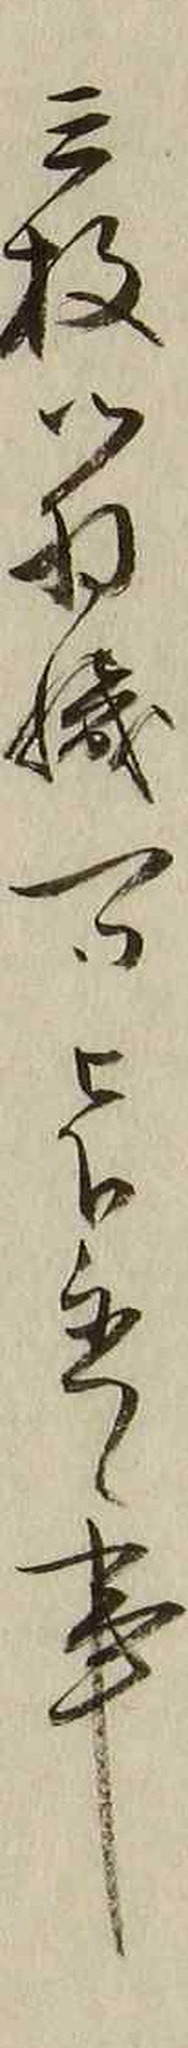三枚御羽織一つ被下置候事
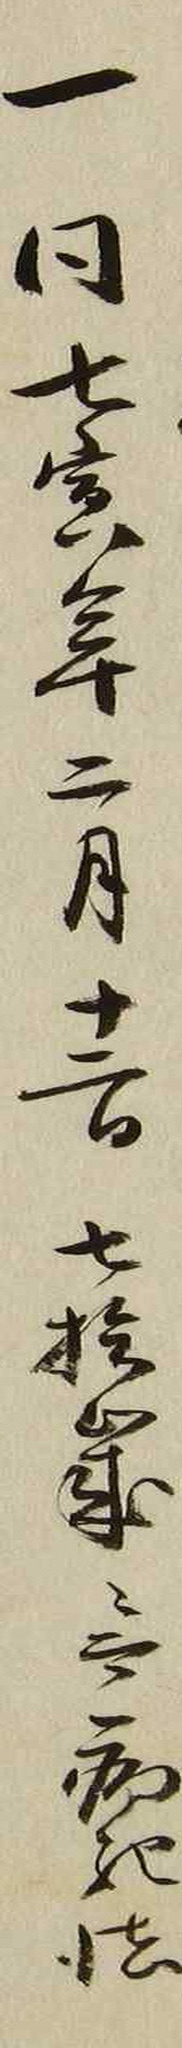一同七寅年二月十二日七拾歳に而病死法
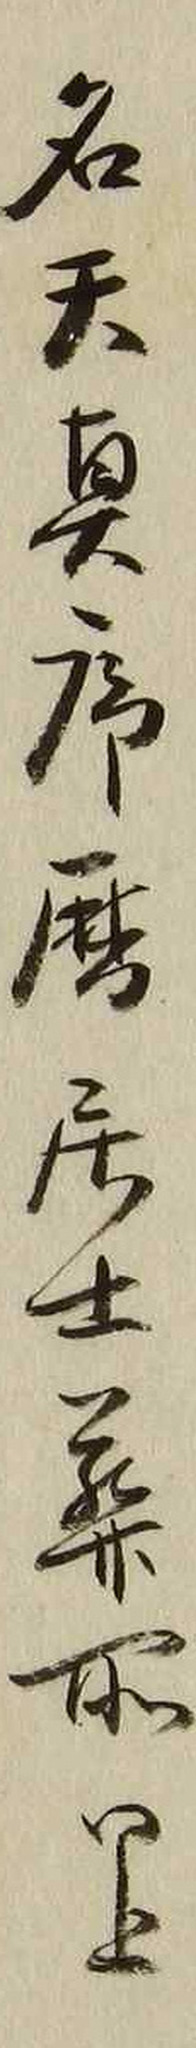名天真序歴居士葬所同上
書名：諸士系譜　巻之292　き之部1
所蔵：会津若松市立会津図書館
